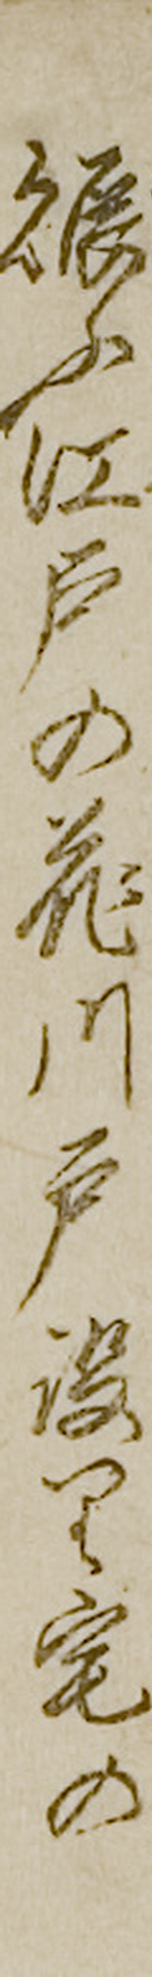賑う江戸の花川戸設り宅の
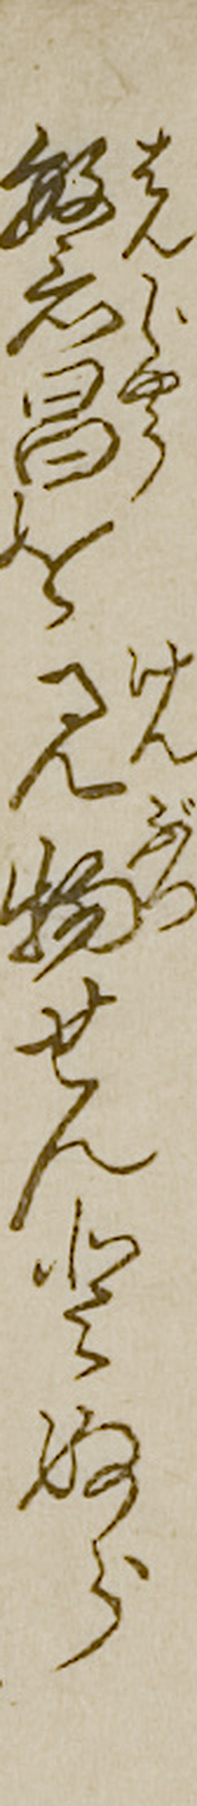繁昌を見物せんとぬら
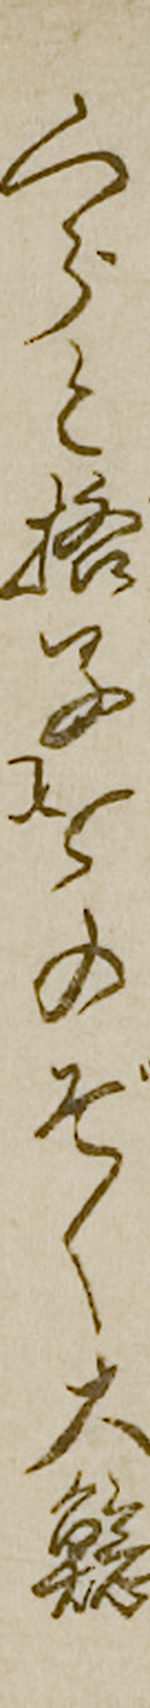くらと格子をのぞく大鯰
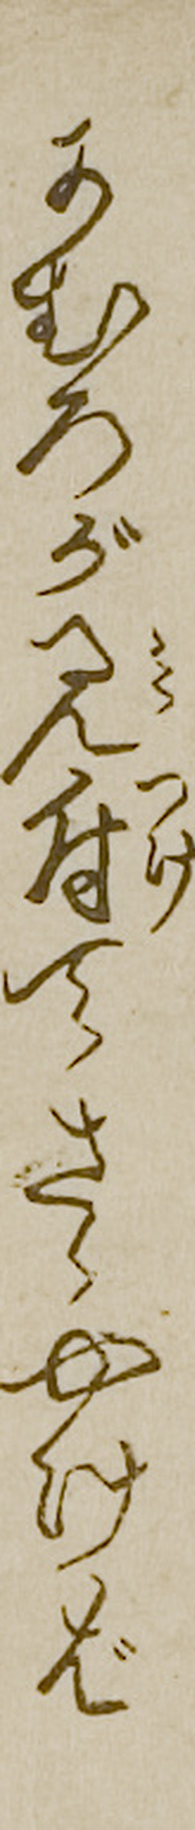かむろが見付てさゝやけば
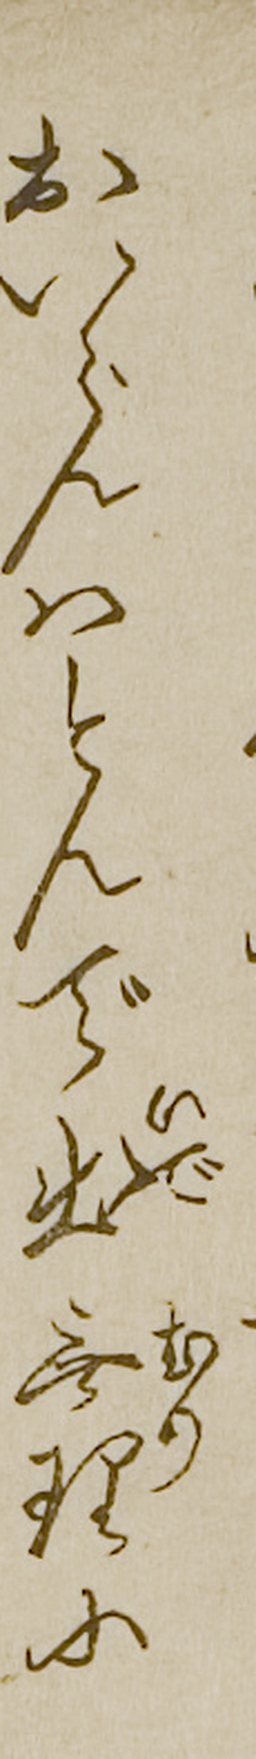おいらんハとんで出無理に
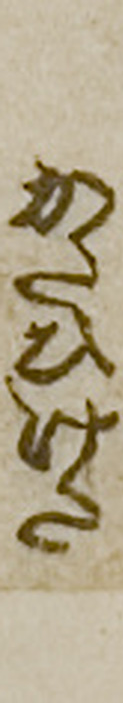かたひげた
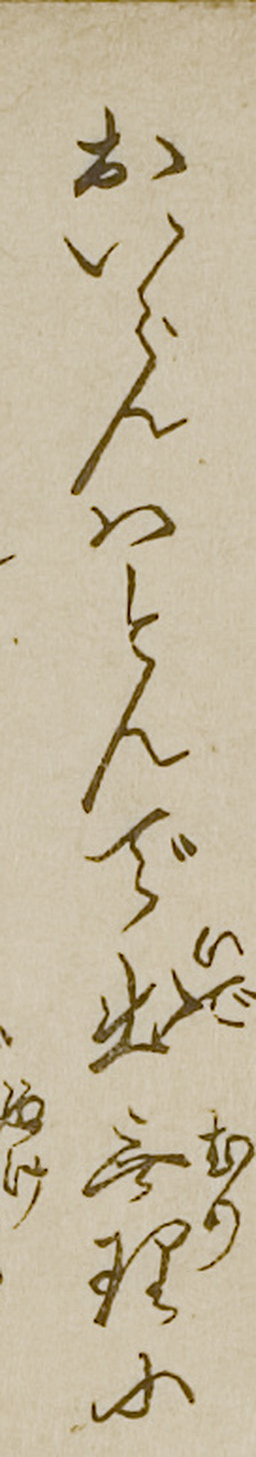おいらんハとんで出無理に
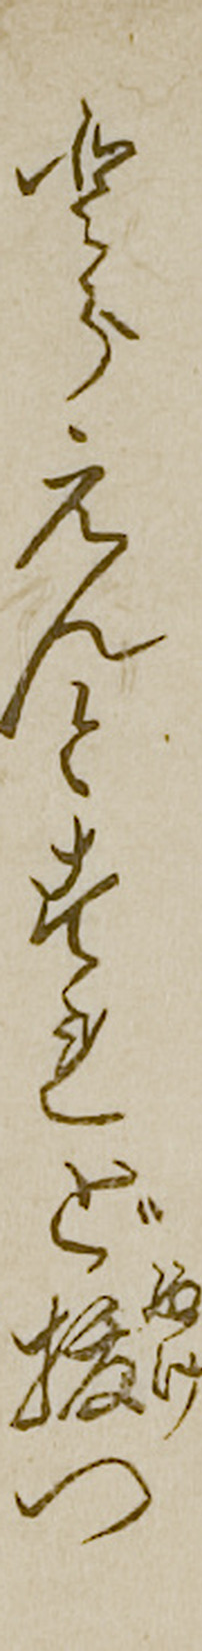とらえんとすれど抜つ
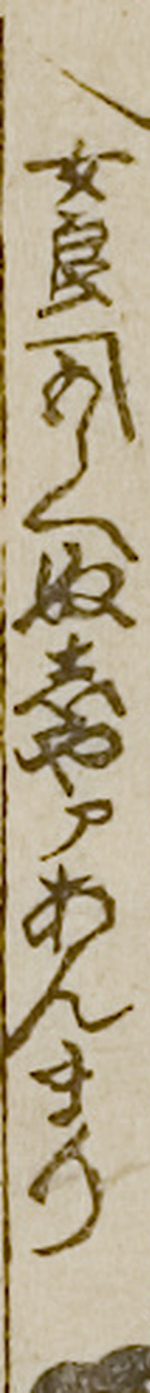女良もしへぬしやァあんまり
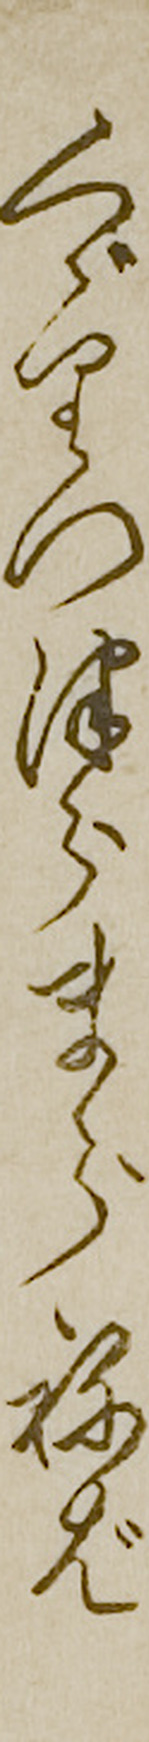くゞりつつらまらねば
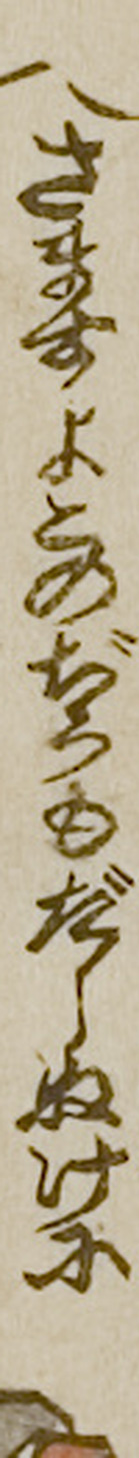さますよこのぢうもだしぬけに
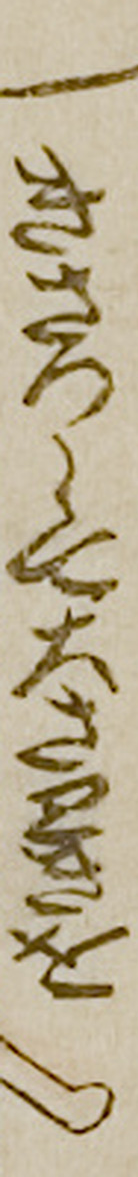きさつして大さわきを
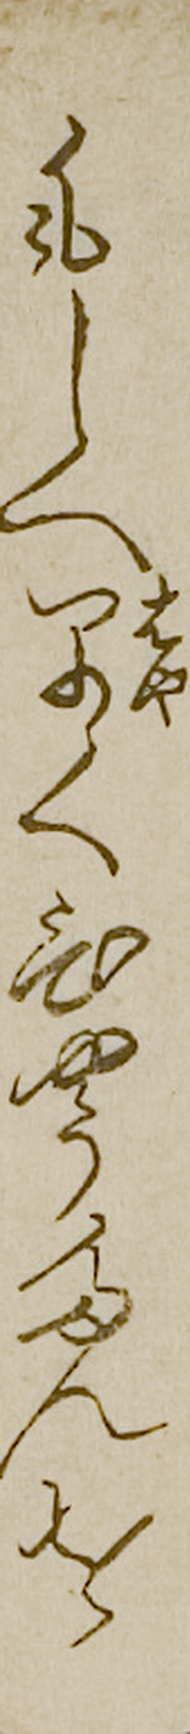もしへ早くひやうたんを
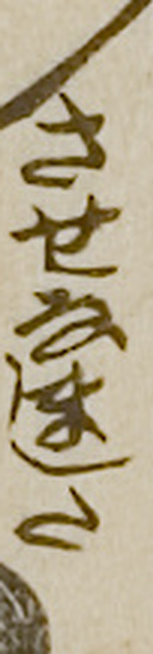させなました
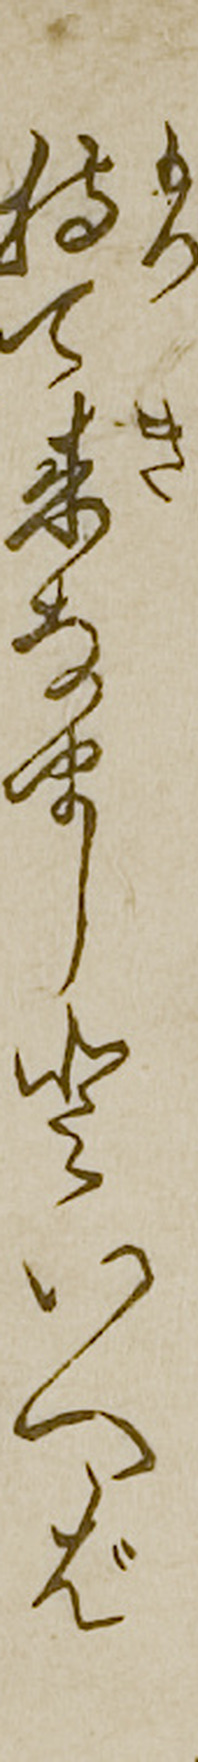持て来なましといへバ
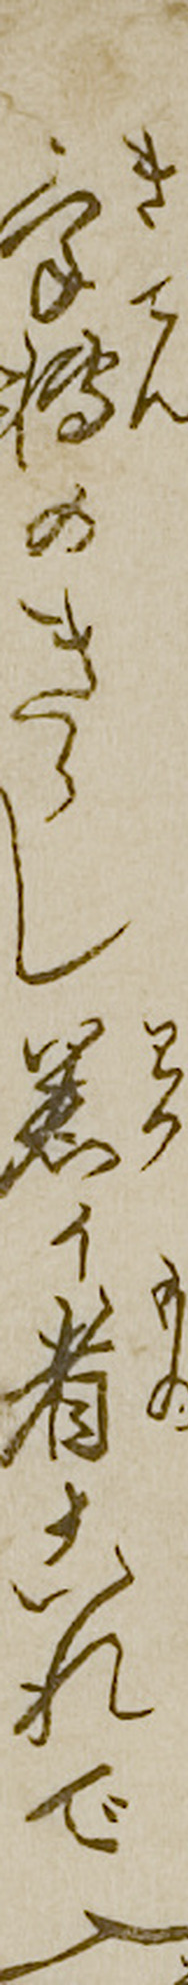気転のきゝし若イ者これで
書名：治る御代ひやかし鯰
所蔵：東京大学総合図書館 General Library in the University of Tokyo, JAPAN
